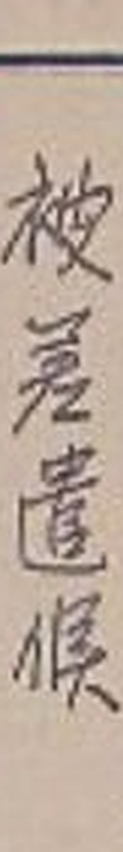被差遣候
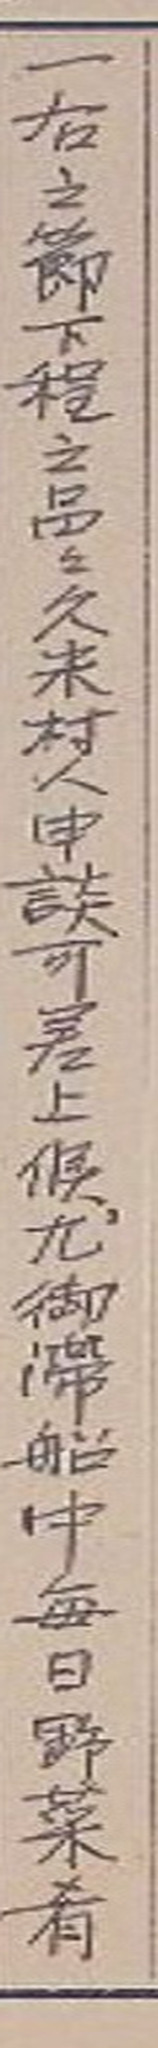一右之節下程之品々久米村人申談可差上候尤御滞船中毎日野菜肴
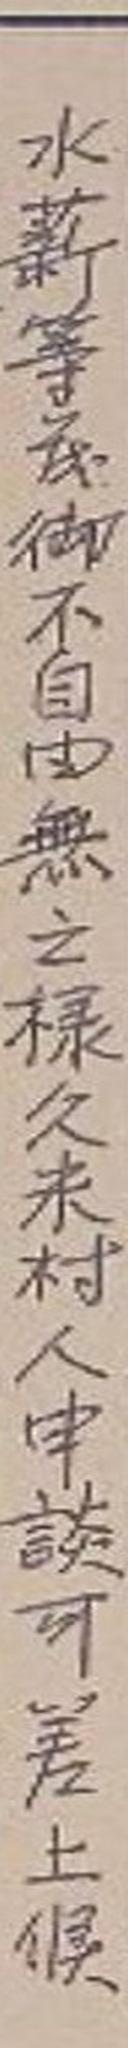水薪等も御不自由無之様久米村人申談可差上候
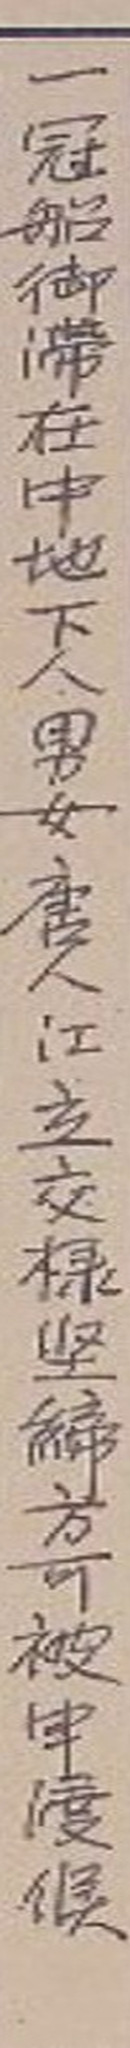一冠船御滞在中地下人男女唐人え立交様堅締方可被申渡候
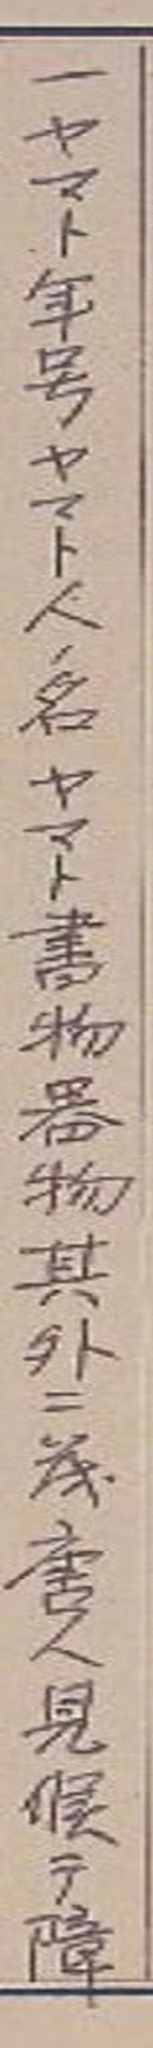一やまと年号やまと人の名やまと書物器物其外にも唐人見候て障
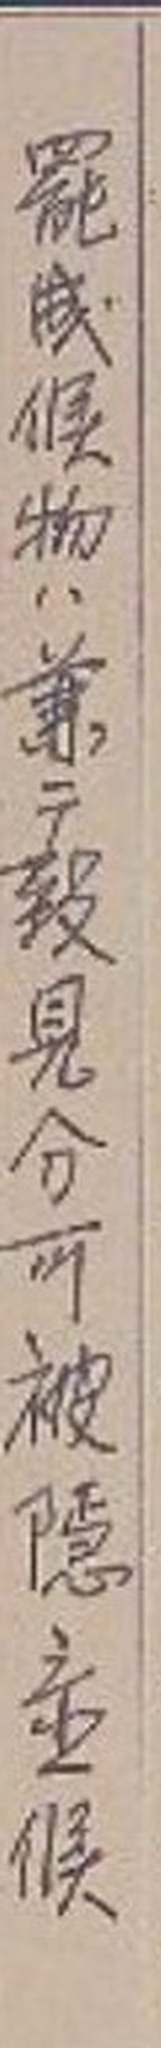罷成候物は兼て致見分可被隠置候

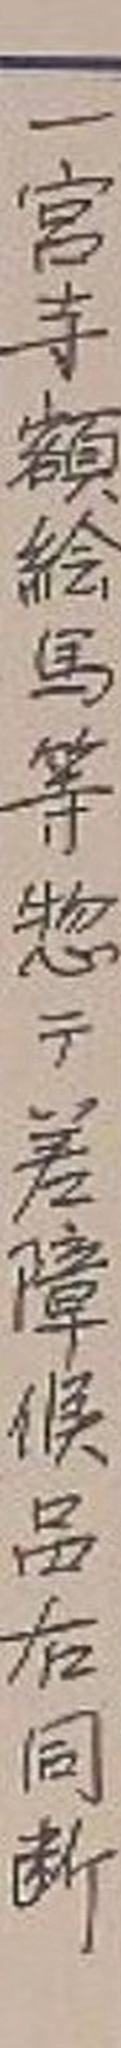一宮寺額絵馬等惣て差障候品右同断
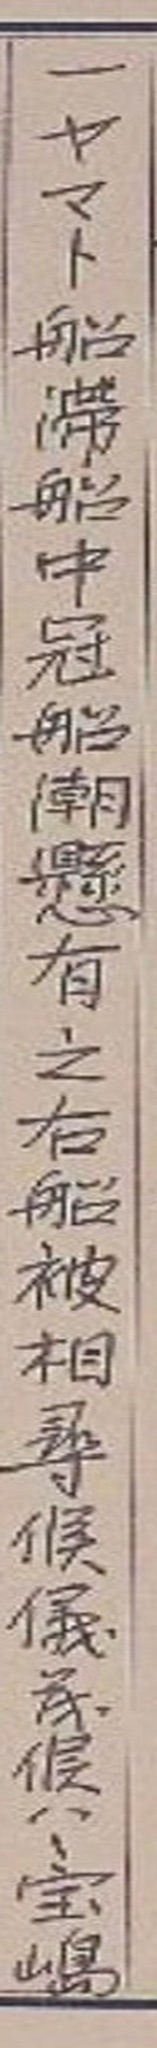一やまと船滞船中冠船潮懸有之右船被相尋候儀も候はゝ宝島
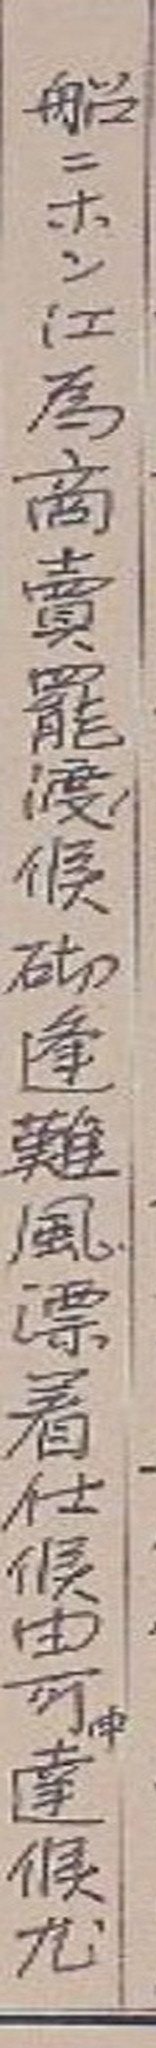船にほんえ為商売罷渡候砌逢難風漂着仕候由可申達候尤
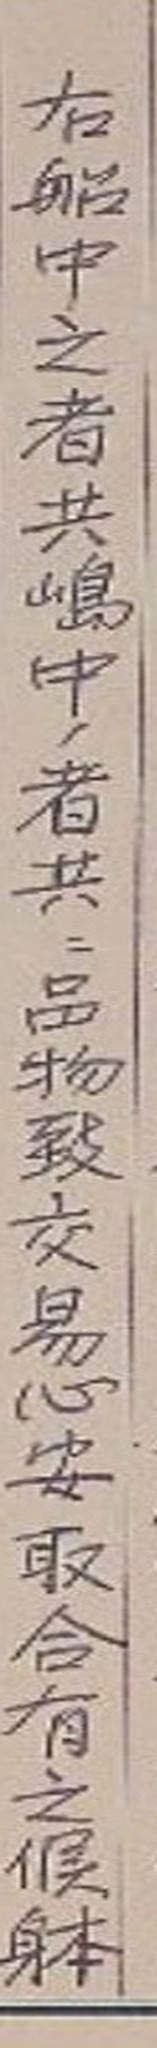右船中之者共島中の者共に品物致交易心安取合有之候躰
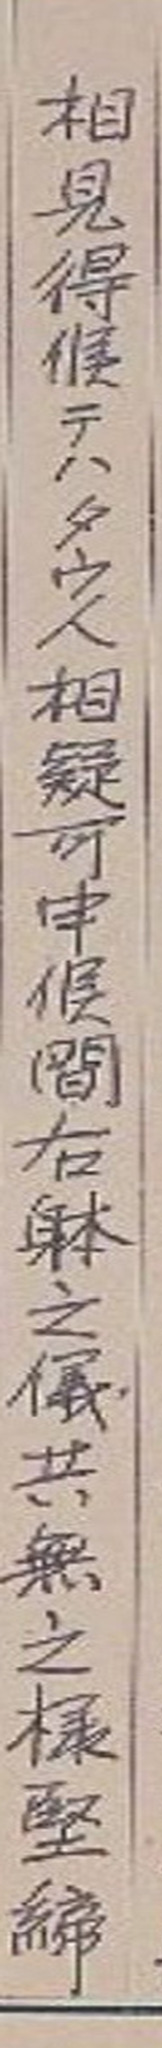相見得候てはたう人相疑可申候間右躰之儀共無之様堅締
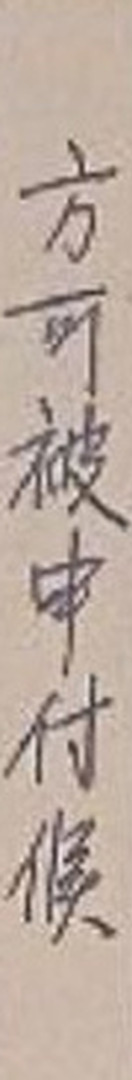方可被申付候
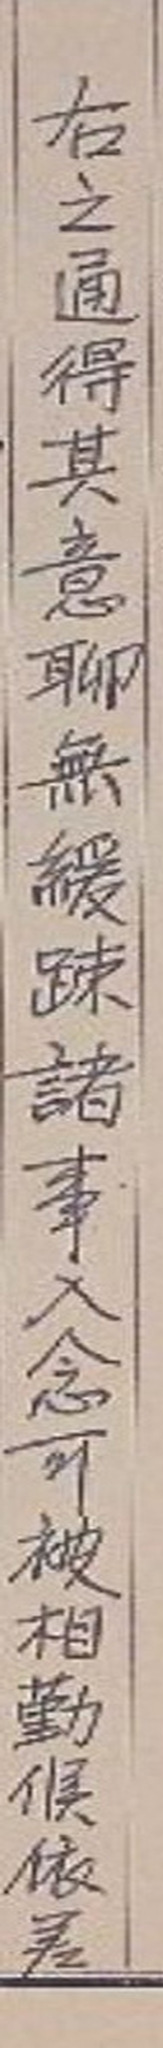右之通得其意聊無緩疎諸事入念可被相勤候依差
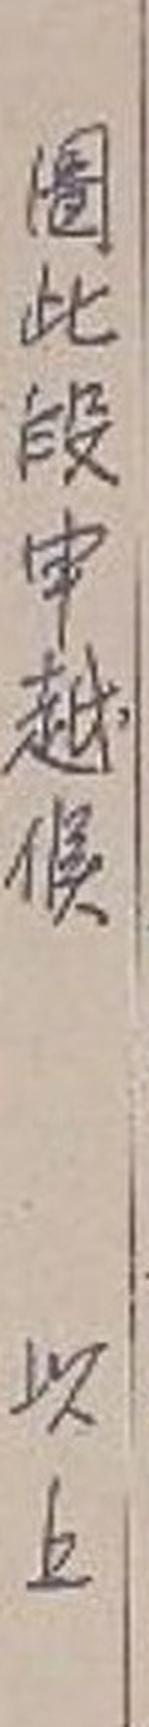図此段申越候以上
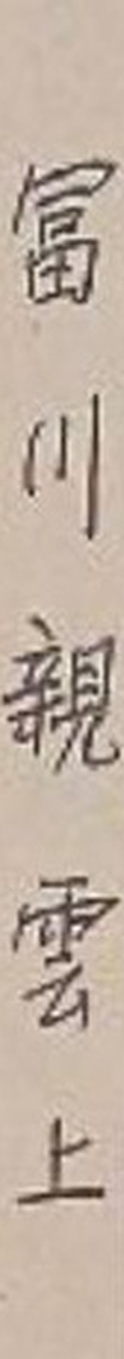古堅親雲上
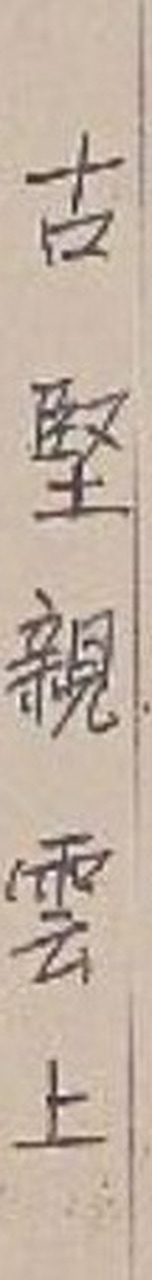古堅親雲上
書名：支那冊封使来琉諸記 下巻
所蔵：University of the Ryukyus Library
